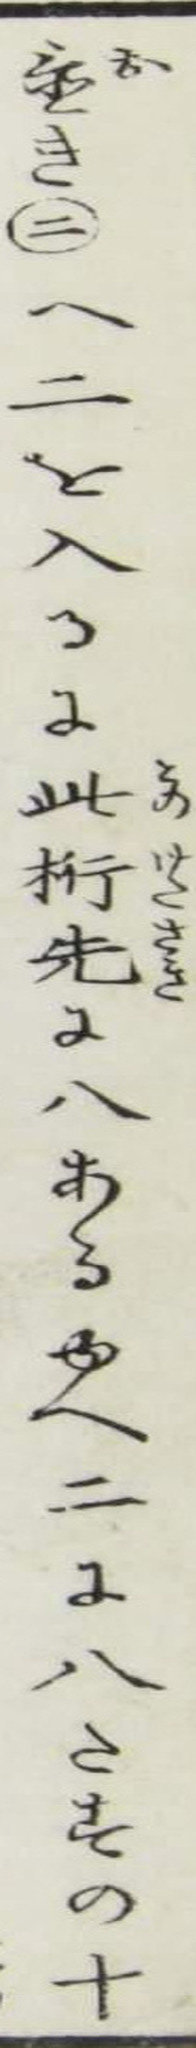置き㋥へ二を入るに此桁先に八あるゆへ二に八たすの十
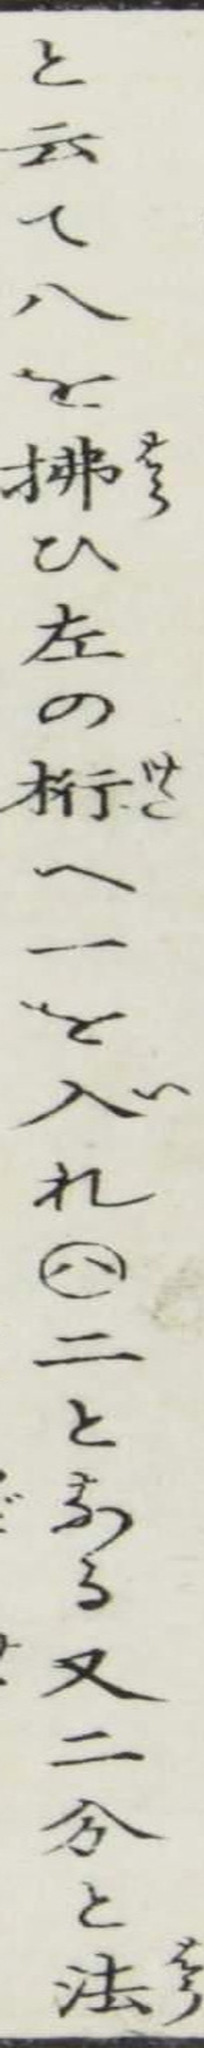と云て八を払ひ左の桁へ一を入れ㋩二となる又二分と法
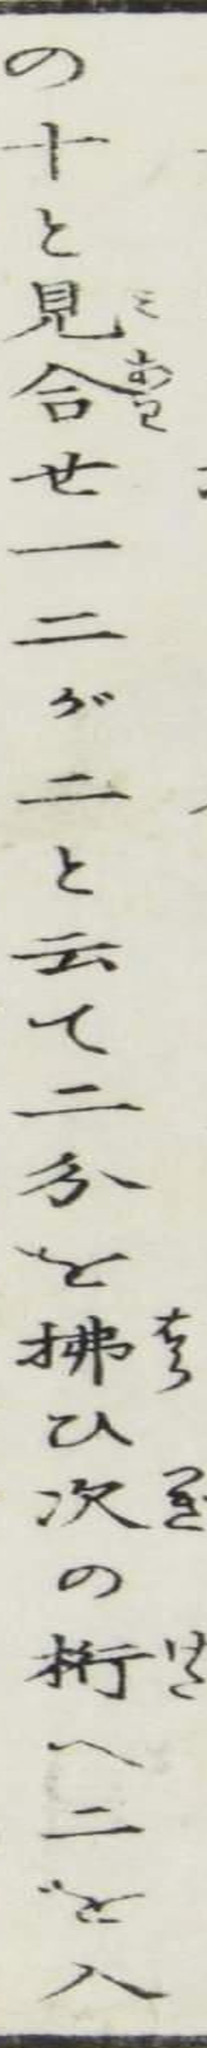の十と見合せ一二が二と云て二分を払ひ次の桁へ二を入
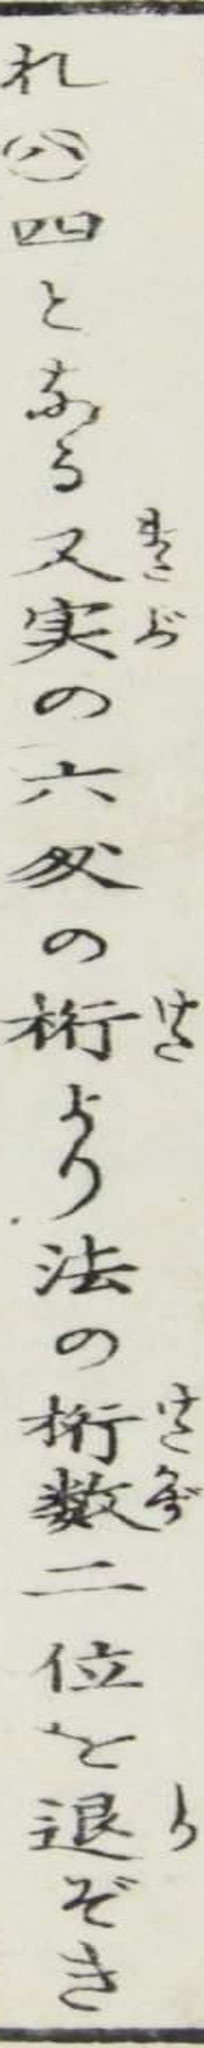れ㋩四となる又実の六匁の桁より法の桁数二位を退ぞき
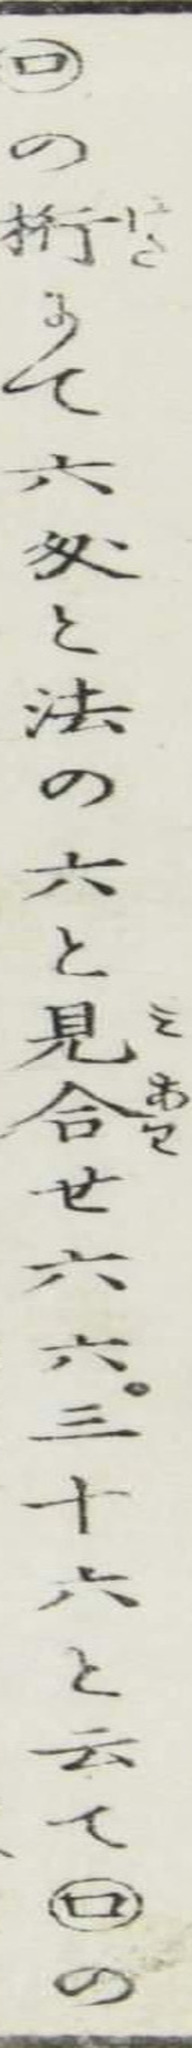㋺の桁にて六匁と法の六と見合せ六六．三十六と云て㋺の
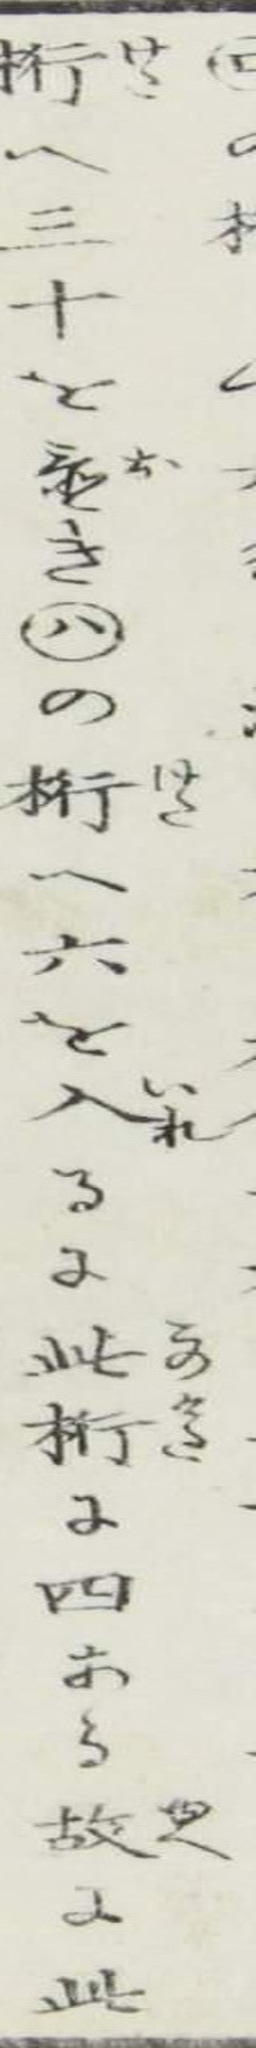桁へ三十を置き㋩の桁へ六を入るに此桁に四ある故に此
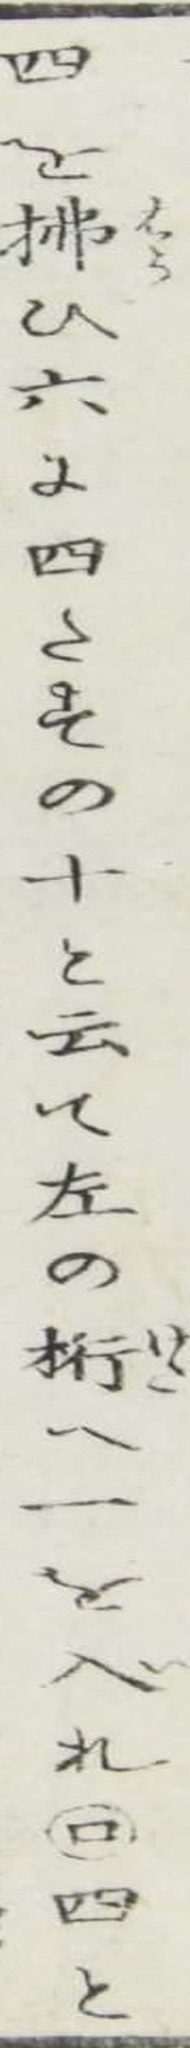四を払ひ六に四たすの十と云て左の桁へ一を入れ㋺四と
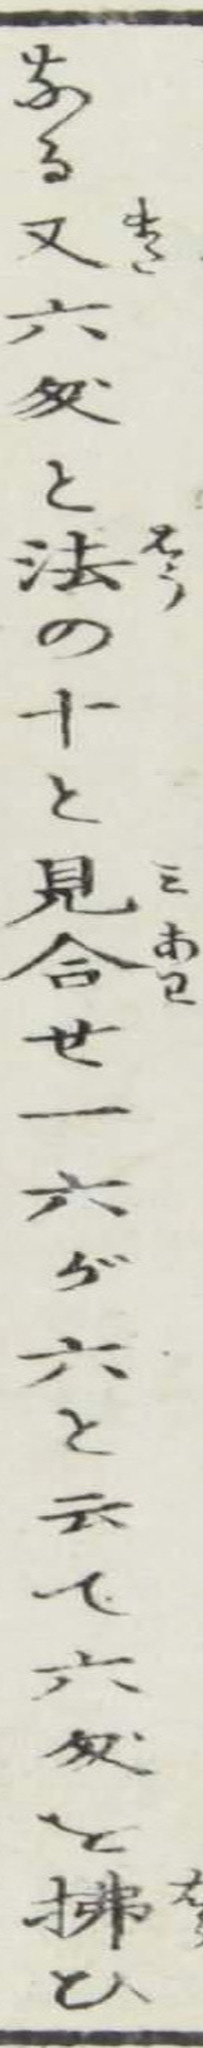なる又六匁と法の十と見合せ一六が六と云て六匁を払ひ
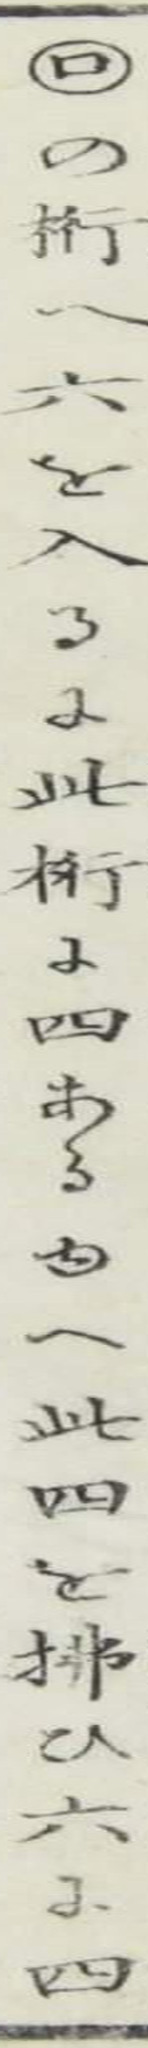㋺の桁へ六を入るに此桁に四あるゆへ此四を払ひ六に四
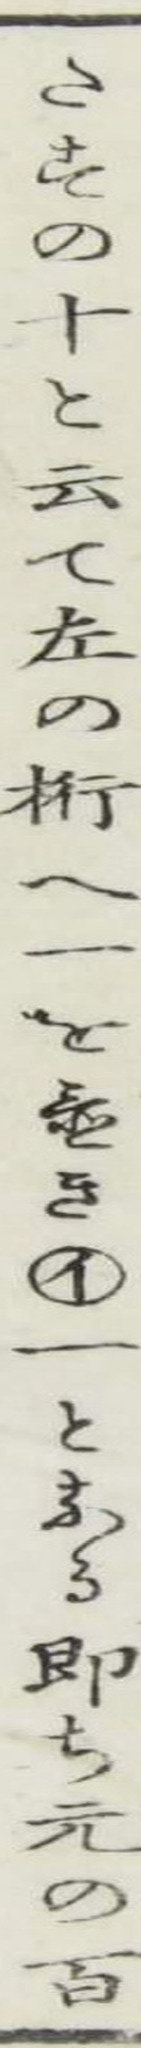たすの十と云て左の桁へ一を置き㋑一となる即ち元の百
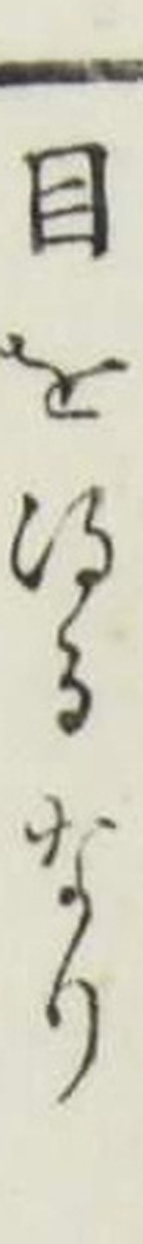目を得るなり
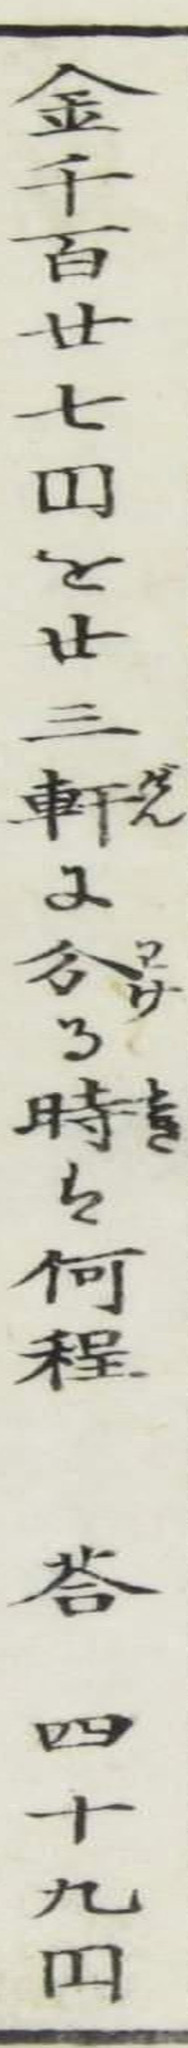金千百廿七円を廿三軒に分る時は何程答四十九円
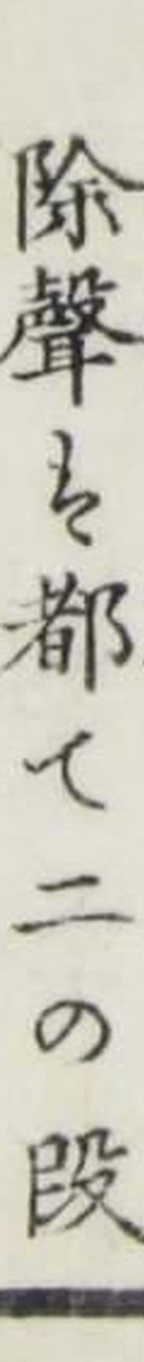除声は都て二の段
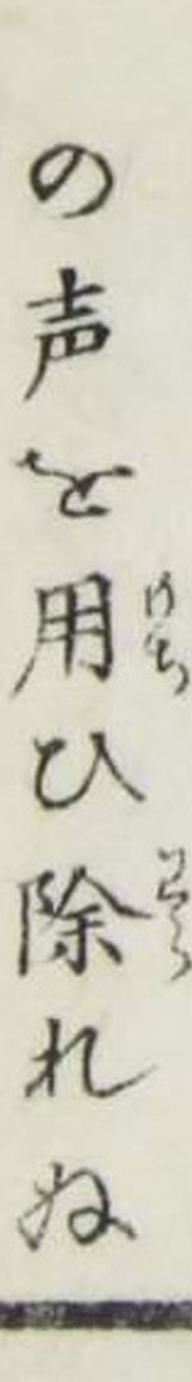の声を用ひ除れぬ
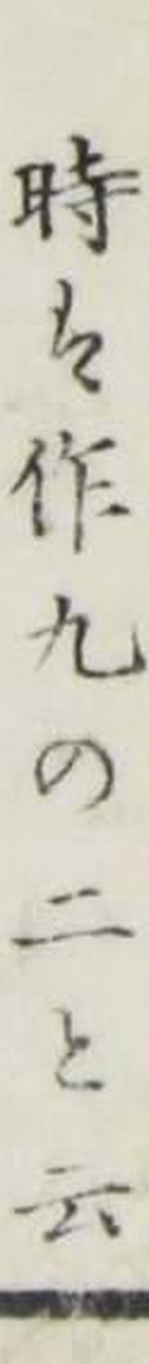時は作九の二と云
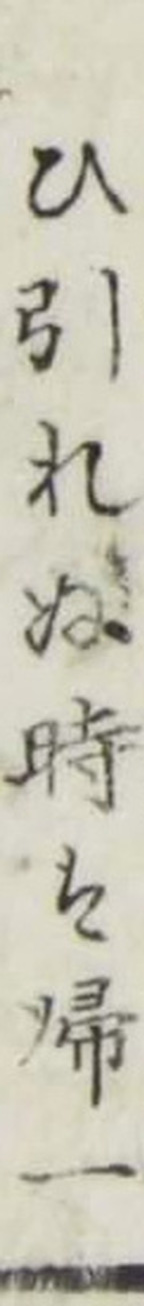ひ引れぬ時は帰一
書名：明治小學塵劫記 卷1
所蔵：東京学芸大学教育コンテンツアーカイブ
